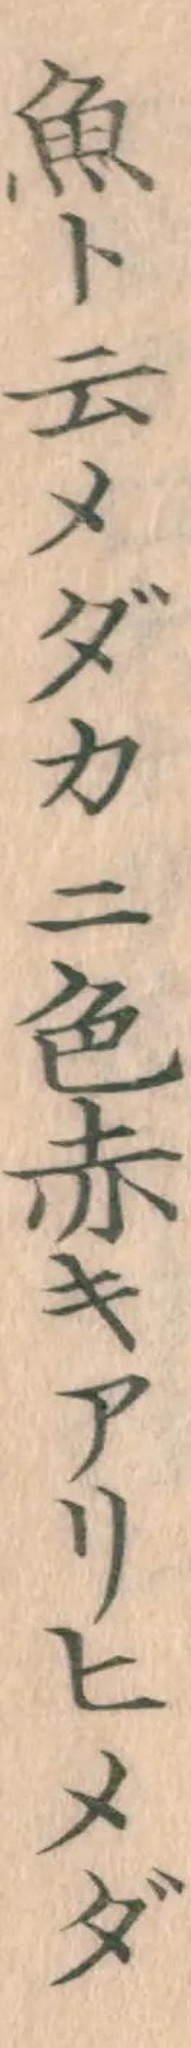魚ト云メダカニ色赤キアリヒメダ
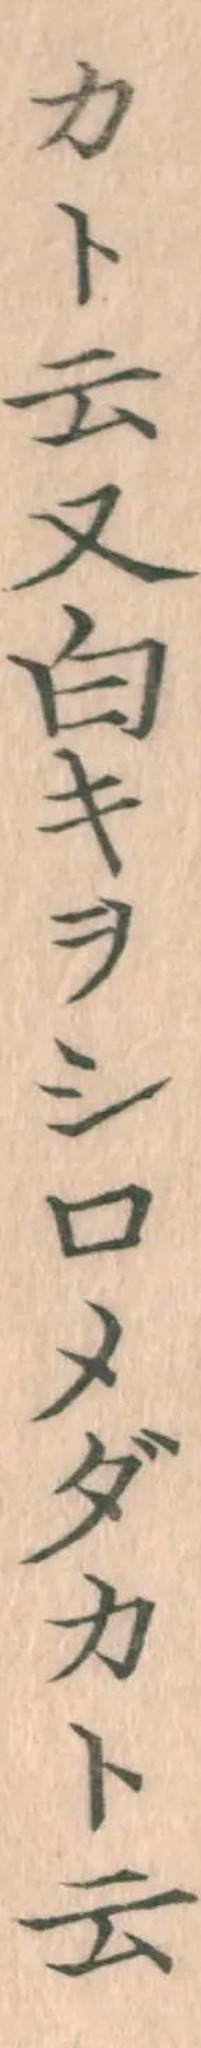カト云又白キヲシロメダカト云
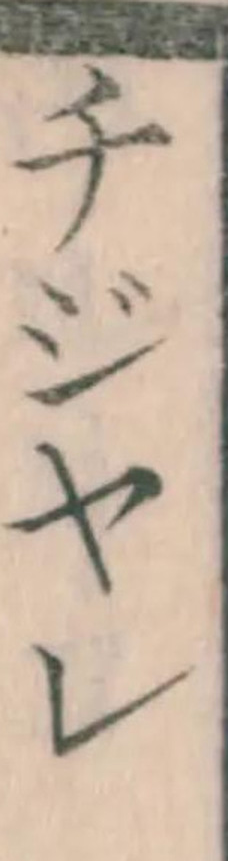チジヤレ
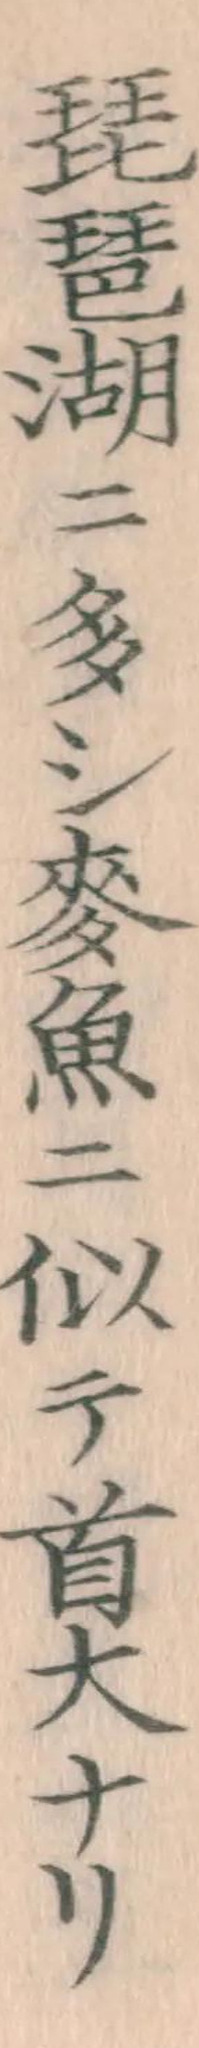琵琶湖ニ多シ麦魚ニ似テ首大ナリ
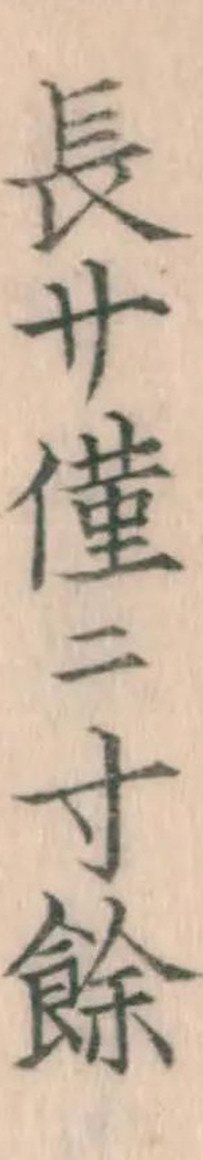長サ僅ニ寸余

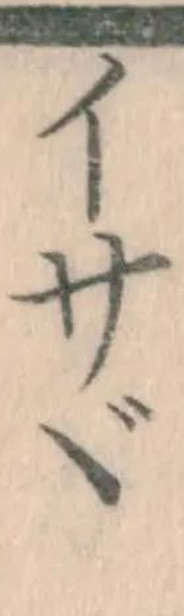イサヾ
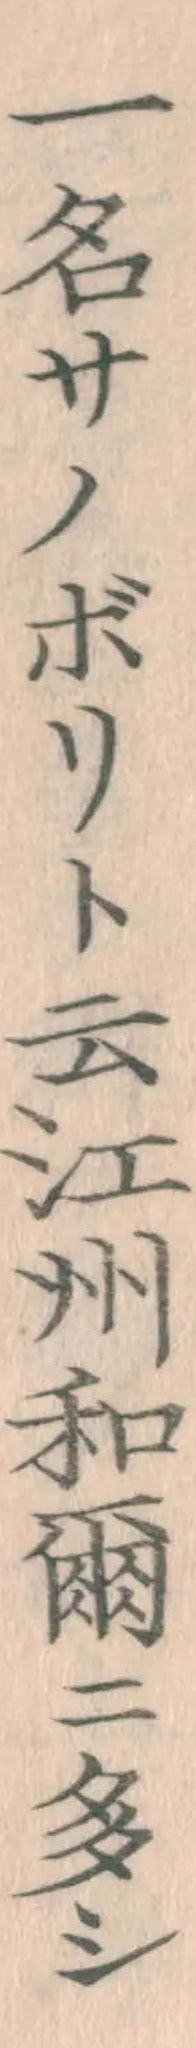一名サノボリト云江州和爾ニ多シ
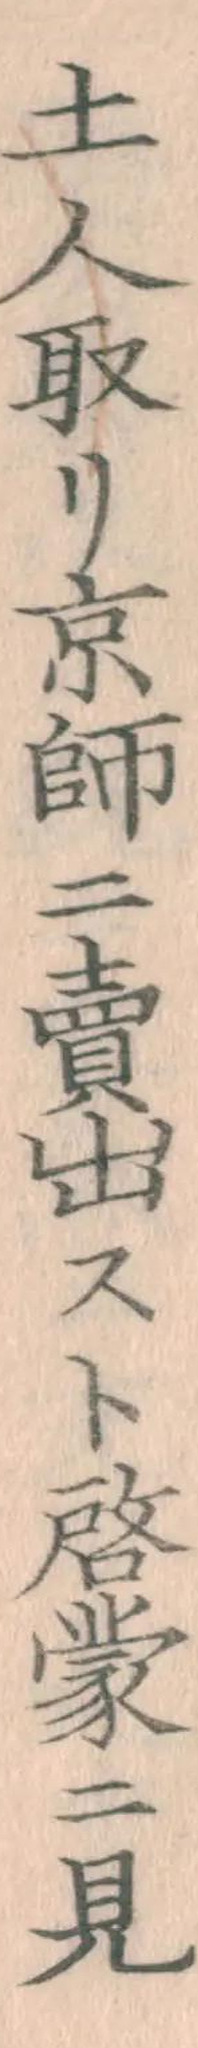土人取リ京師ニ売出スト啓蒙ニ見
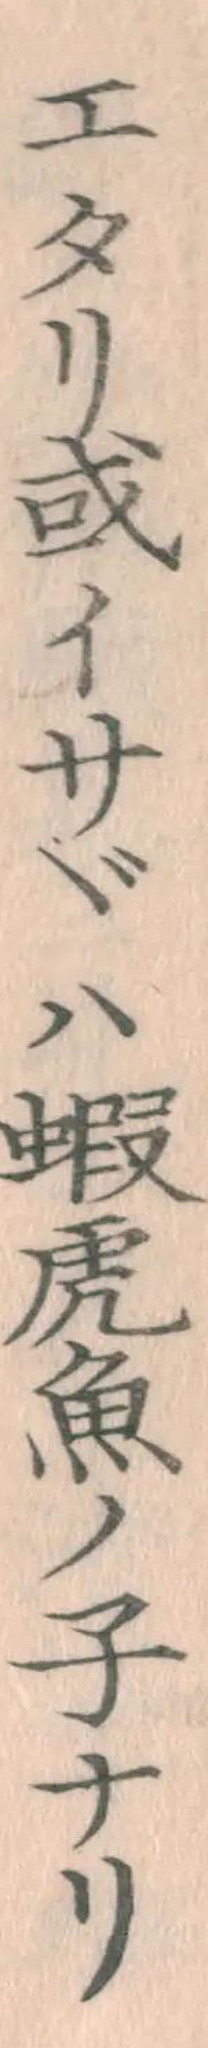エタリ或イサヾハ蝦虎魚ノ子ナリ
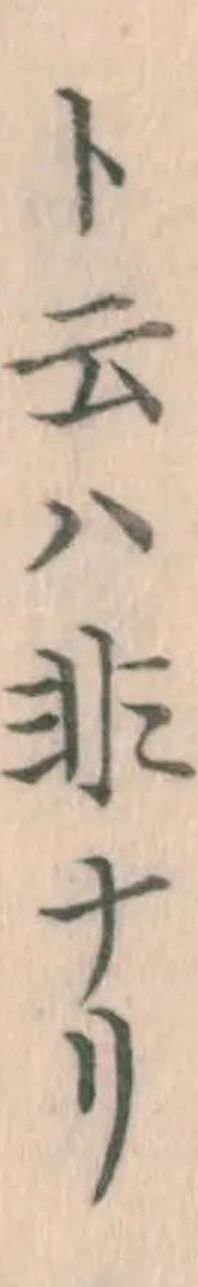ト云ハ非ナリ
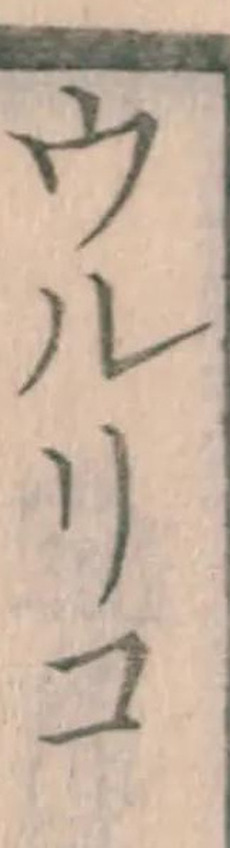ウルリコ
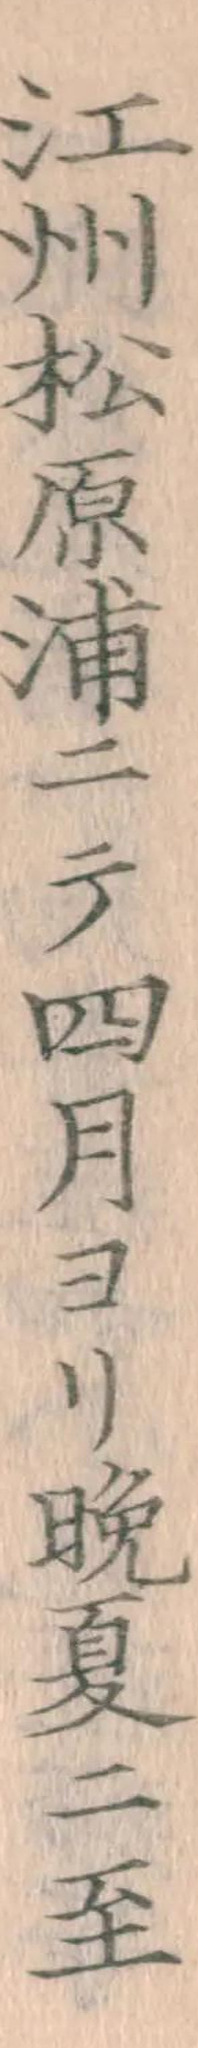江州松原浦ニテ四月ヨリ晩夏ニ至
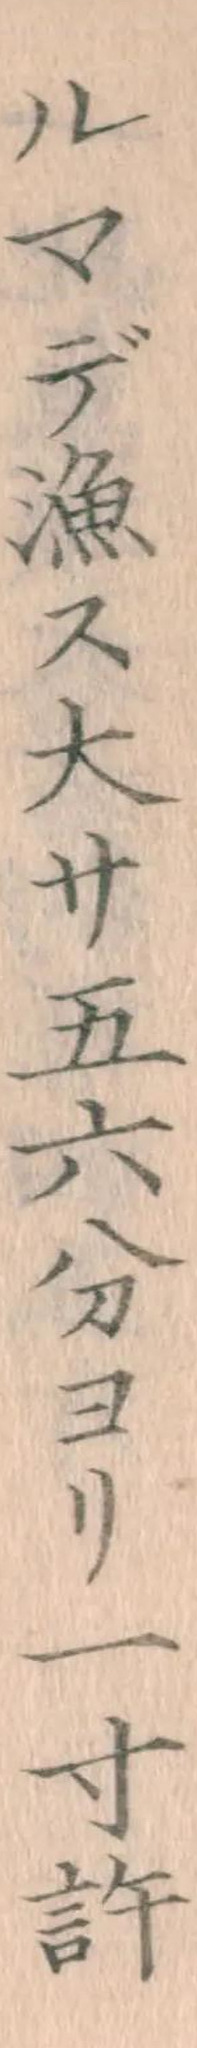ルマデ漁ス大サ五六分ヨリ一寸許
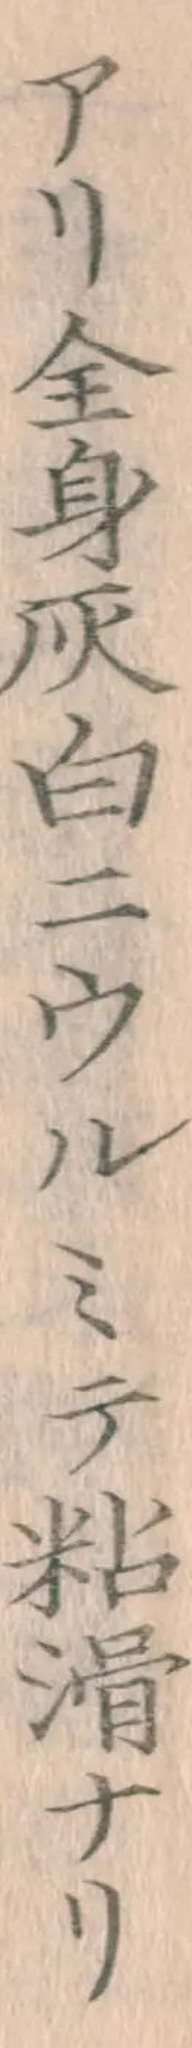アリ全身灰白ニウルミテ粘滑ナリ
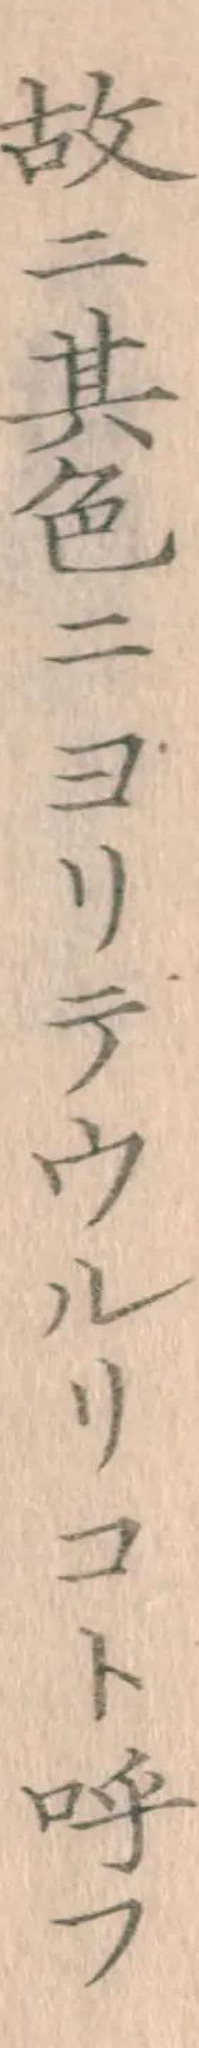故ニ其色ニヨリテウルリコト呼フ
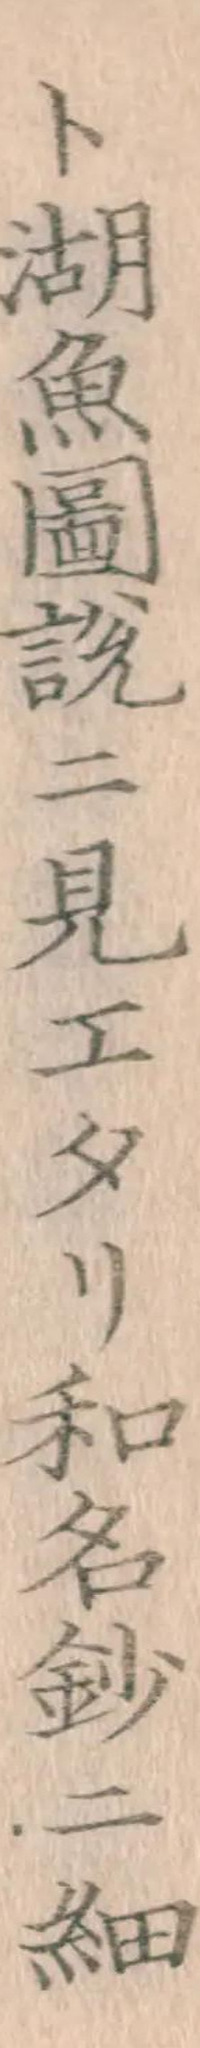ト湖魚図説ニ見エタリ和名鈔ニ細
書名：皇和魚譜 2巻
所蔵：国立国会図書館 National Diet Library, JAPAN
